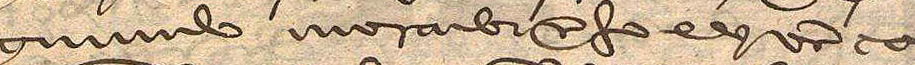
gumdo morador ē hollyvēca
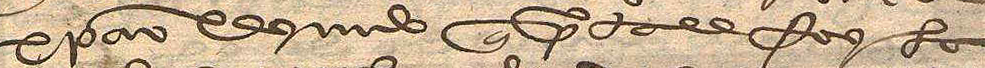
xpão llymdo q̄ p̄o tall foy ha
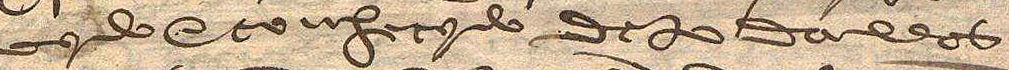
vydo e conhecydo de todallas
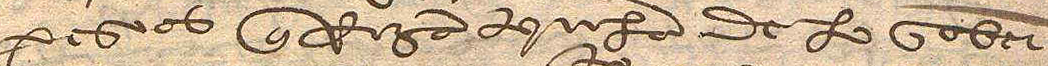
pesoas q̄ Reezā tynhā de ho saber
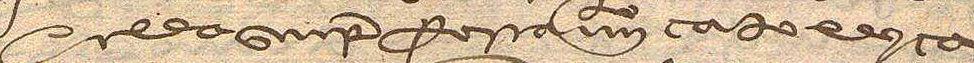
e ella senp̄ forra mto catollyca
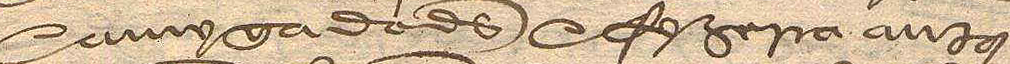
e amyga de d̄s e fyzerra autꝯ
